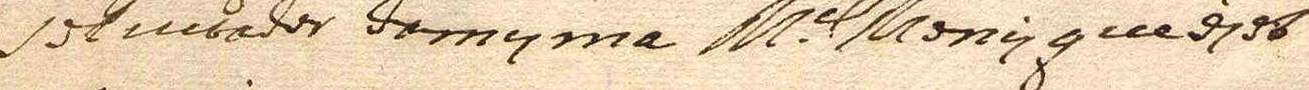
solicitador da mesma M.el Monis que o sob
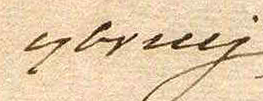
escreuj
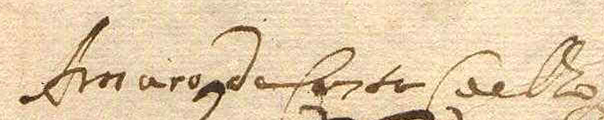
Amaro da Costa Coelho
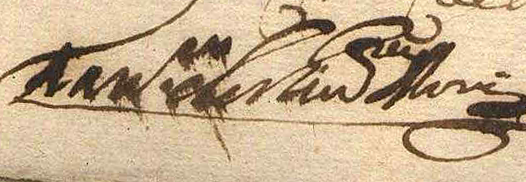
Franco de oliura Monis
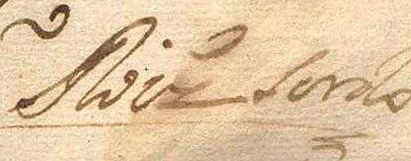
Roiz̄ sordo
